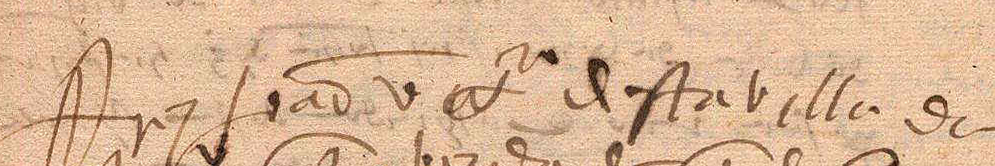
frej João vigro desta villa da
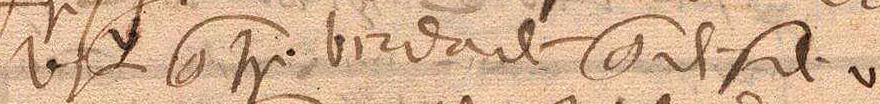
vro q̄ he verdade q̄ desde o
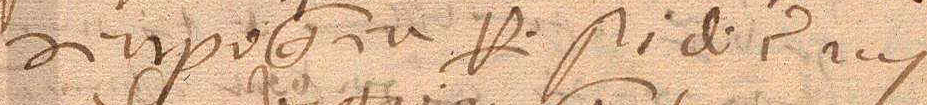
tenpo q̄ eu Resido ē mj
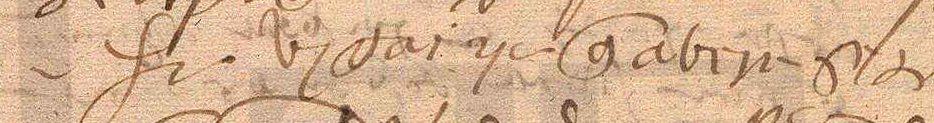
nha vjgairja q̄ avera sete
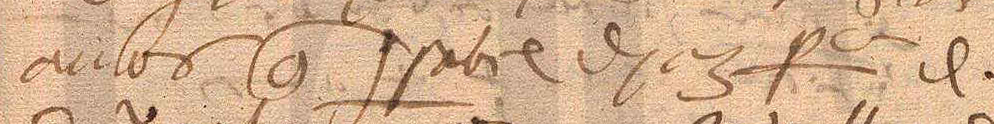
anos q̄ Jsabel djaz fa de
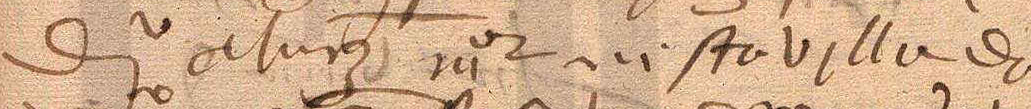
djo aluez̄ mor nesta villa da
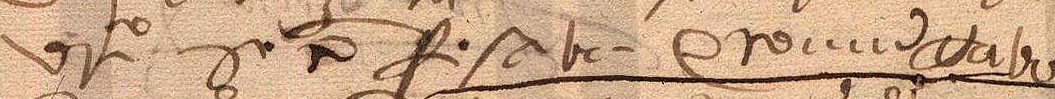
vro se cōfesava e comūgava
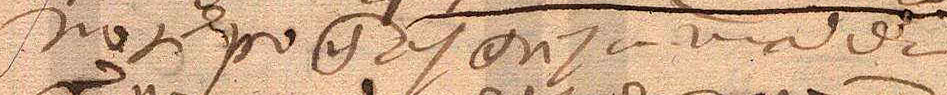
no tēpo q̄ a jgreja māda
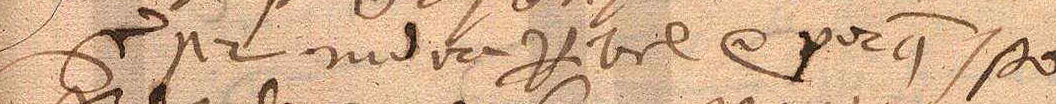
sē ser nūca Rebel e porq̄ Jsto
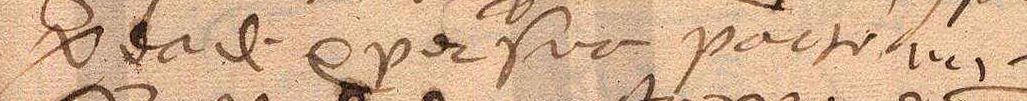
ꝟdade e por sua parte me
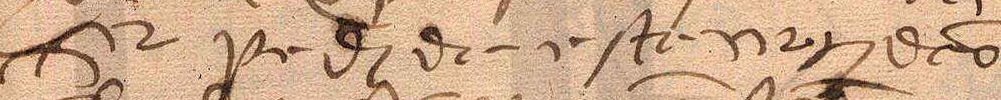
ser pedjda esta certjdaõ
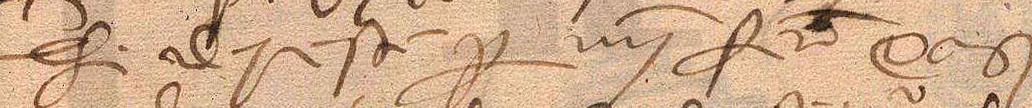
lhe dej este ꝑ mj̄ ftō e asj
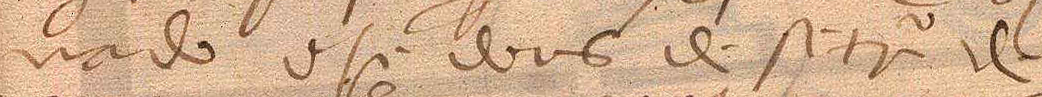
nado oJe dous de setro de
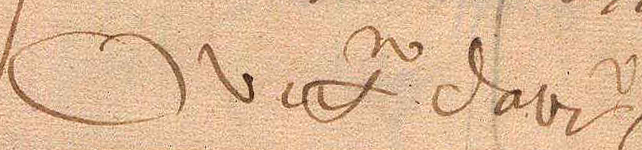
O vigro davro
